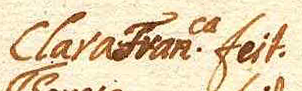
Clara Fran.ca feit.
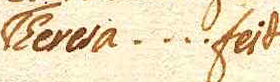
Theresa . . . . feit.
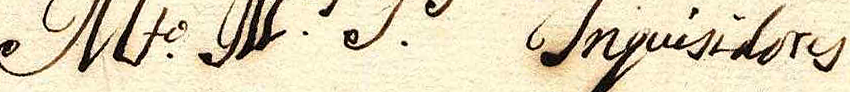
Mt.o Ill̄.es S.es Inquisidores
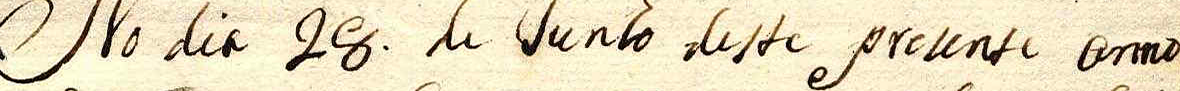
No dia 28. de Iunho deste presente anno
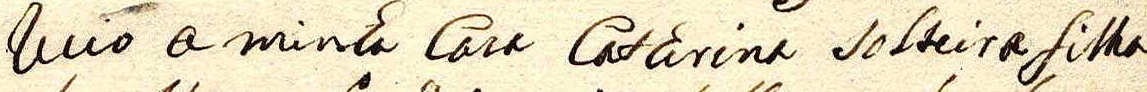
Veio a minha Caza Catherina solteira filha
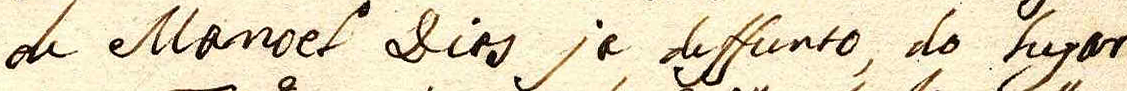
de Manoel Dias ja deffunto, do lugar
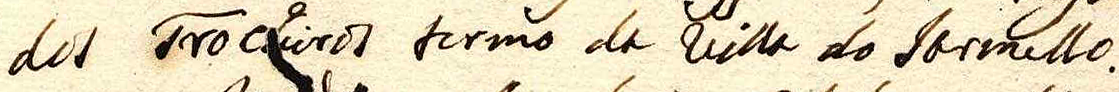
dos Trocheiros termo da villa do Iarmello.
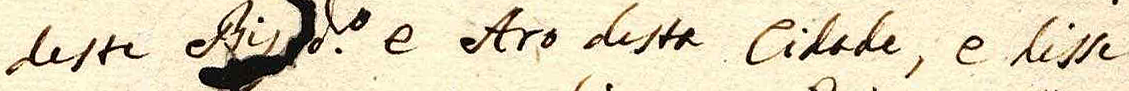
deste Bis_d.o e Aro desta Cidade, e disse
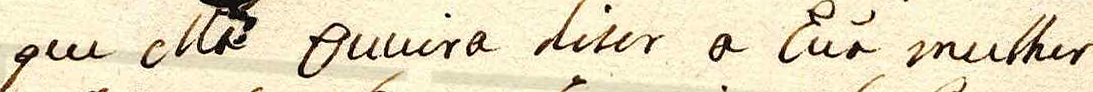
que ella Ouuira dizer a huā mulher
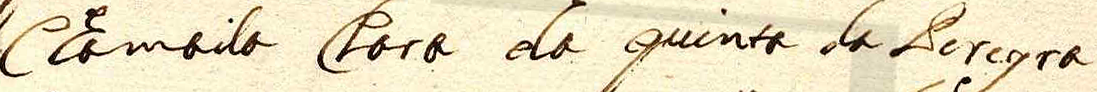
Chamada Clara da quinta da Pereyra
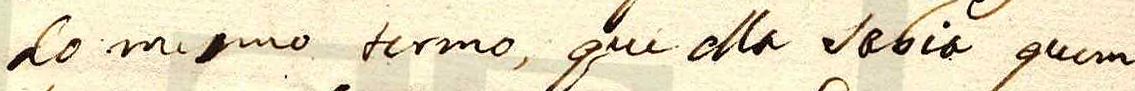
do mesmo termo, que ella sabia quem
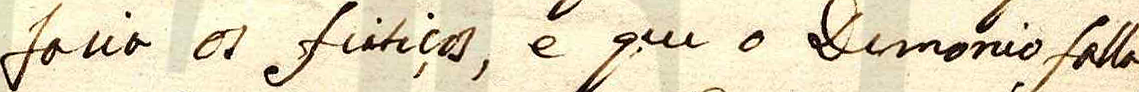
fazia os feitiços, e que o Demonio falla
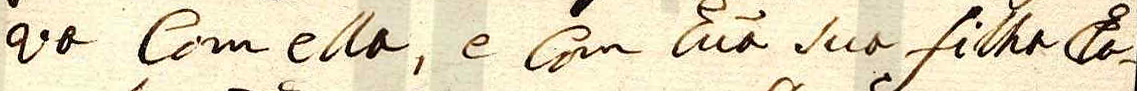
va Com ella, e Com huā sua filha cha
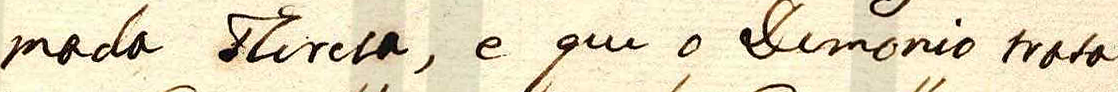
mada Thereza, e que o Demonio trata
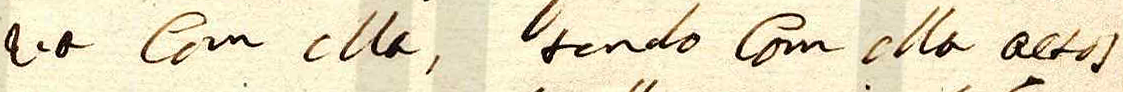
va Com ella, tendo Com ella actos
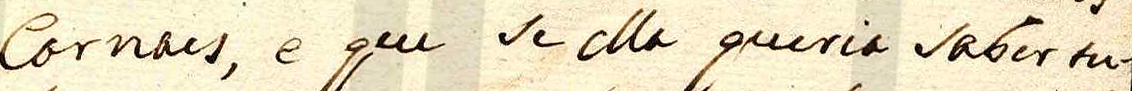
Carnaes, e que se ella queria saber tu
